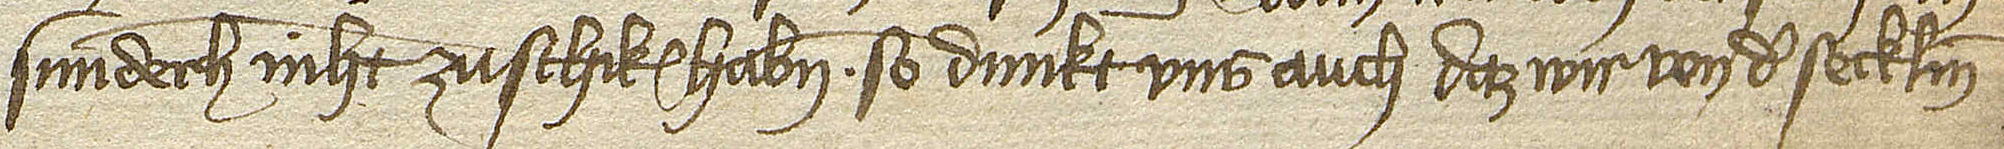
ſunderh* niht ʒuſchik* habn* . ſo dunkt vns auch daʒ wir von d* ſecklin*
